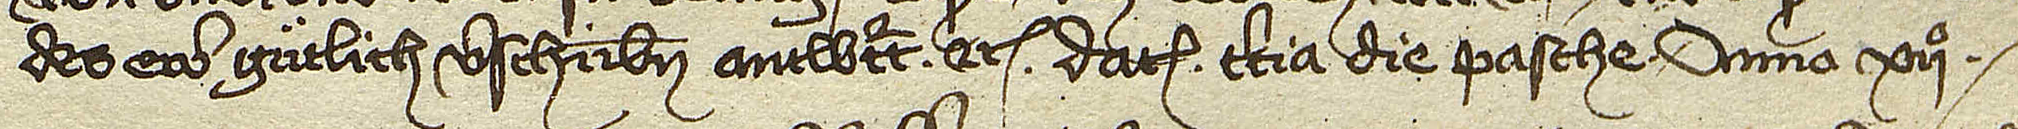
des ew* gütlich v*ſchribn* antwtw* . ec* . dar* . t*cia die paſche / Anno xii* . /
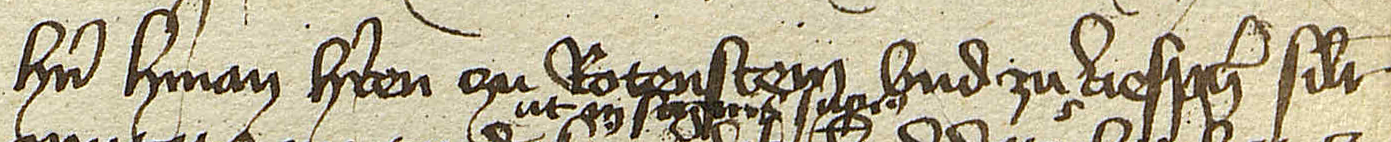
hn* H*man hr*en cʒu Rotenſtein vnd cʒu Lieſpg* ſilr*
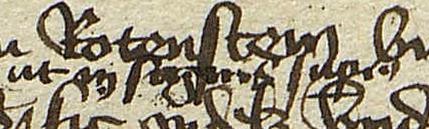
ut in ſignis ſup*
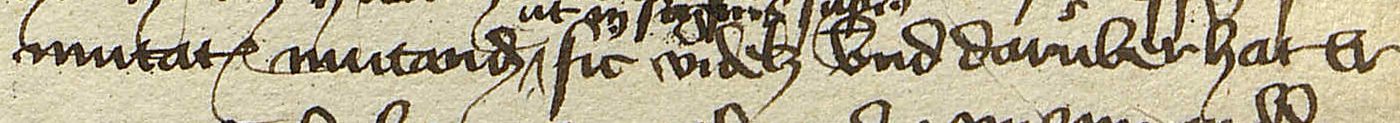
mutat mutand fic videl* vnd darüber hat Er
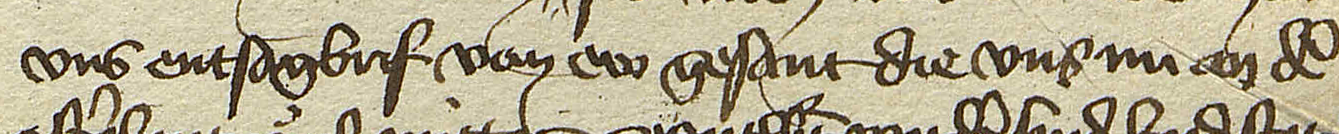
vns entſagbrif von ew geſant die vns nu an d*
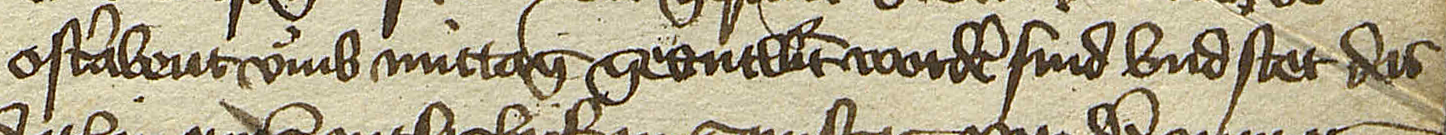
oſt*abent v̈mb mittag geantwt* worde* ſind vnd ſtet das
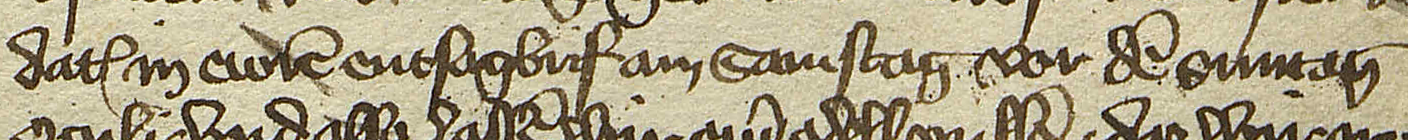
dat* in ewre* entſagbrif am Samſtag vor de* Suntag
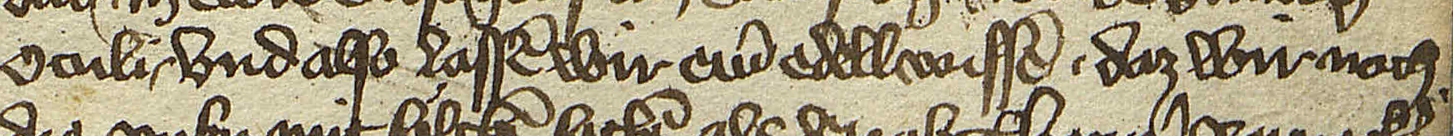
Oculi / vnd alſo laſſe* wir ew* edell wiſſe* / daʒ wir noch
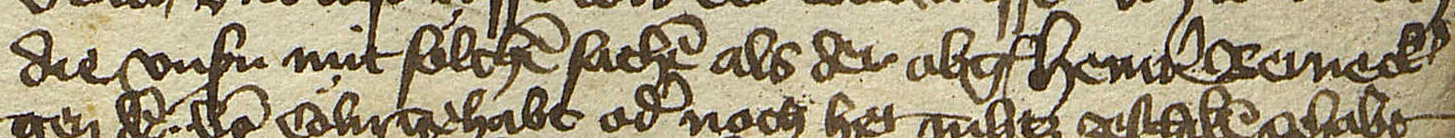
die vnſ*n mit ſöliche* ſache* als der obg* Heinr* Berneck*
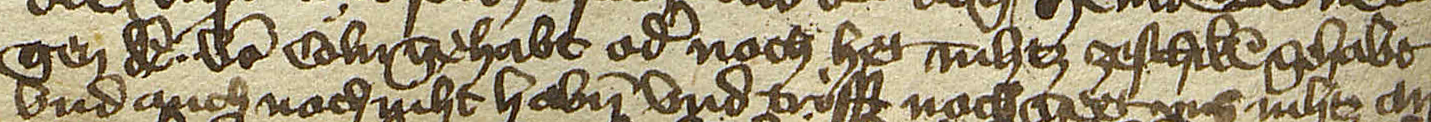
gen de* ~ vo* Cöln gehabt od* noch het nichtʒ cʒeſchike* gehabt
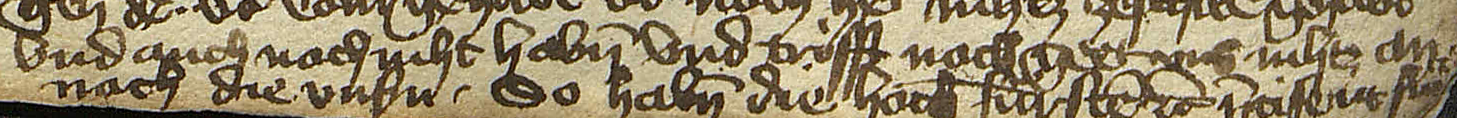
vnd auch noch niht habn* vnd trifft noch geet vns niht an
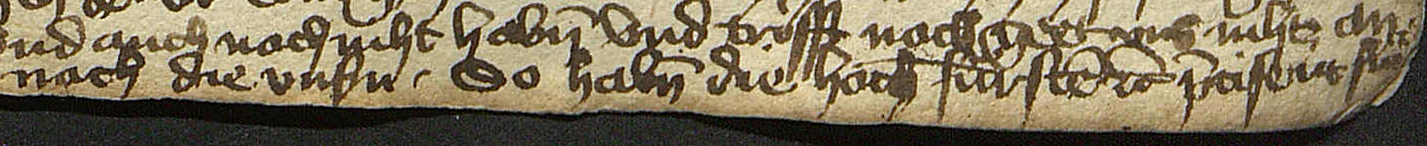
noch die vnſ*n / So habn* die hoch* fürſte* ec* p*ciſe ut ſup*
